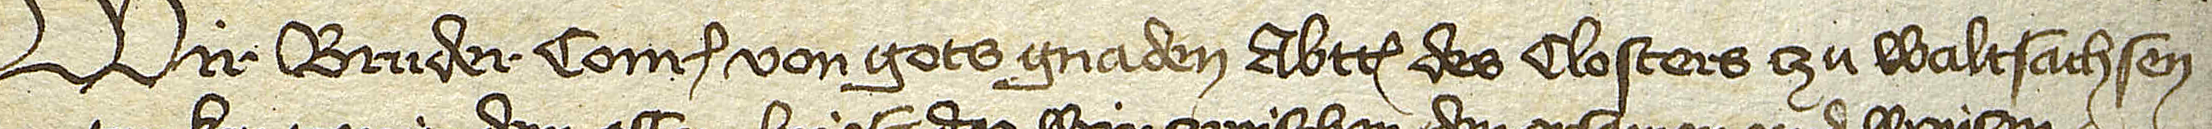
Wir Bruder Com* von gots gnaden Abtt* des Cloſters cʒu waltſachſen
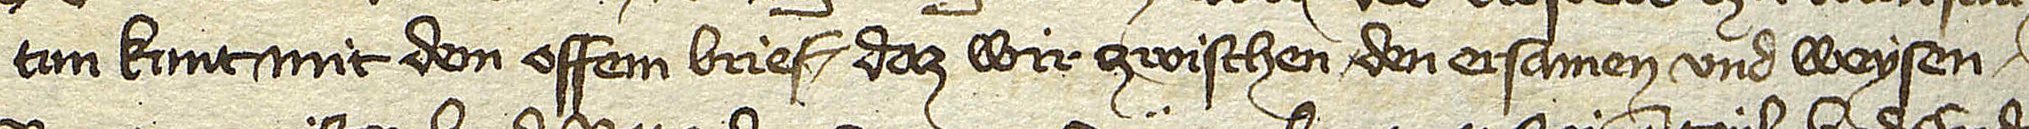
tun kunt mit dem offem brief / daʒ wir cʒwiſchen / den erſamen vnd weyſen /
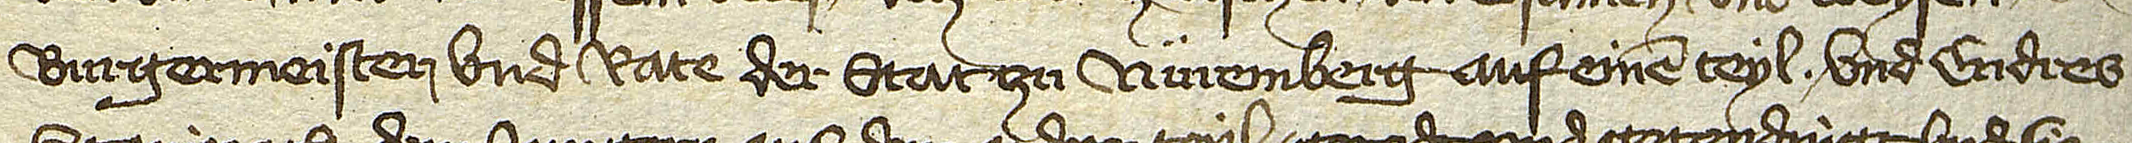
Burgermeiſter vnd Rate der Stat cʒu Nüremberg auf eine* teyl*. / vnd Endres
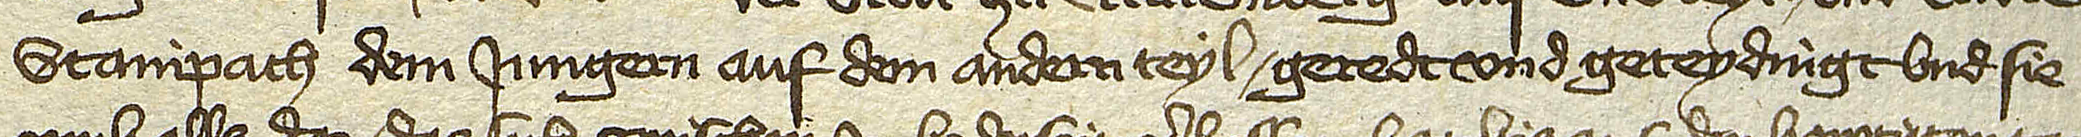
Stainpach dem Iungern auf dem andern teyl / geredt vnd geteydingt vnd ſie
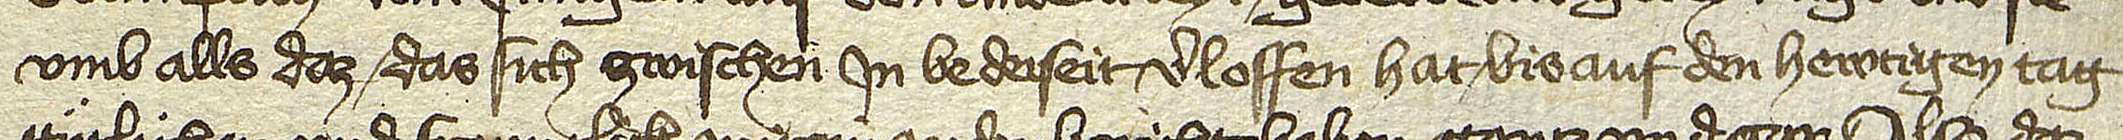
vmb alles daʒ / das ſich cʒwiſchen In bederſeit v*loffen hat / bis auf den hewtigen tag
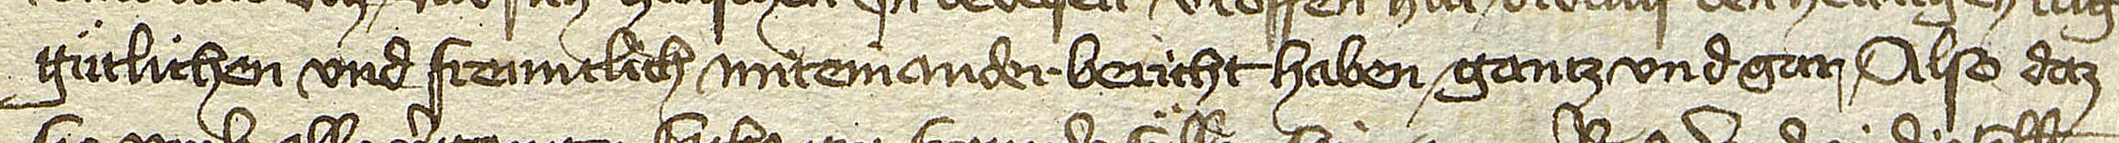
gütlichen vnd freuntlich miteinander bericht haben / gancʒ vnd gar / Alſo daʒ
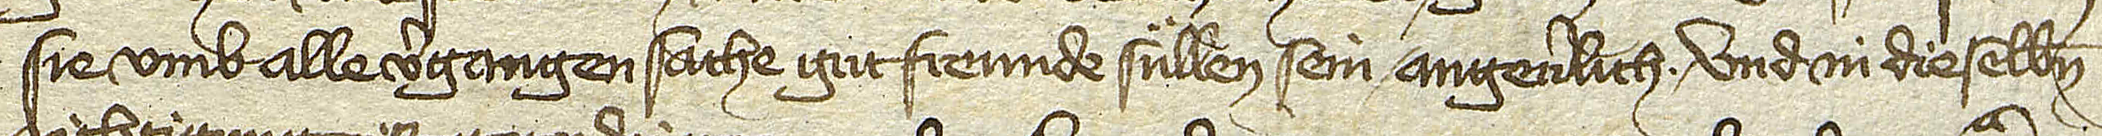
ſie vmb alle v*gangen ſache gut freunde ſüllen ſein / angeu*lich ./ vnd in dieſelbn*
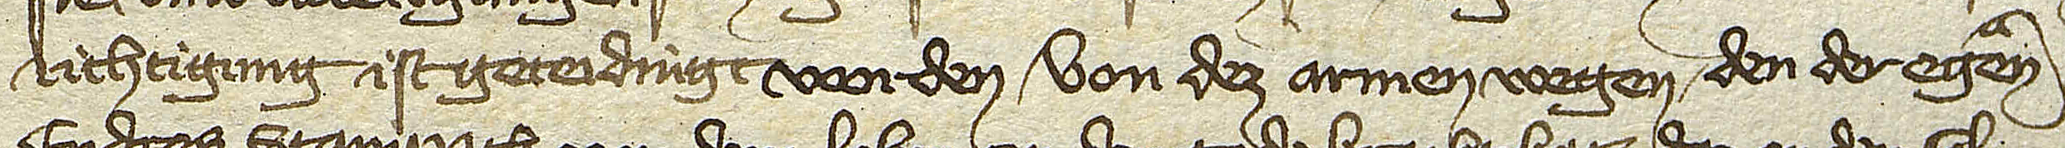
richtigung iſt geteidingt voor den / von deʒ armen wegen / den der egen*
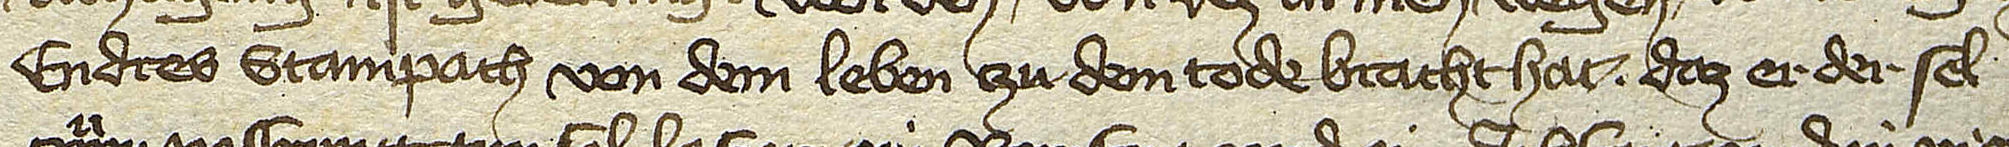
Endres Stainpach von dem leben cʒu dem tode bracht hat . daʒ er der ſel
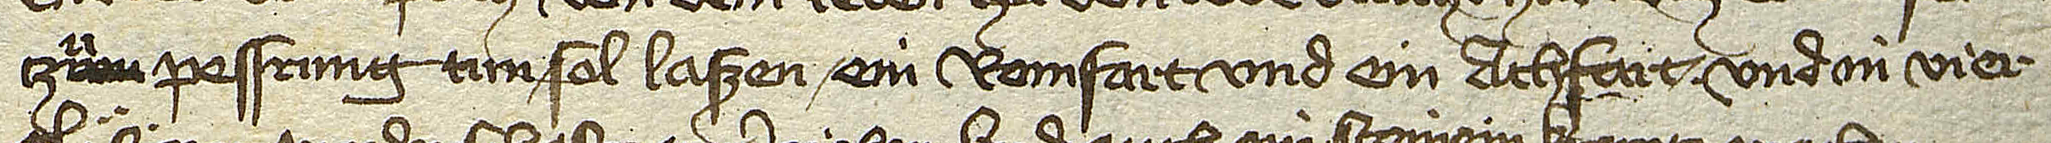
cʒum peſſrung tun ſol laſʒen / ein Romfart vnd ein Achfart . vnd in vier
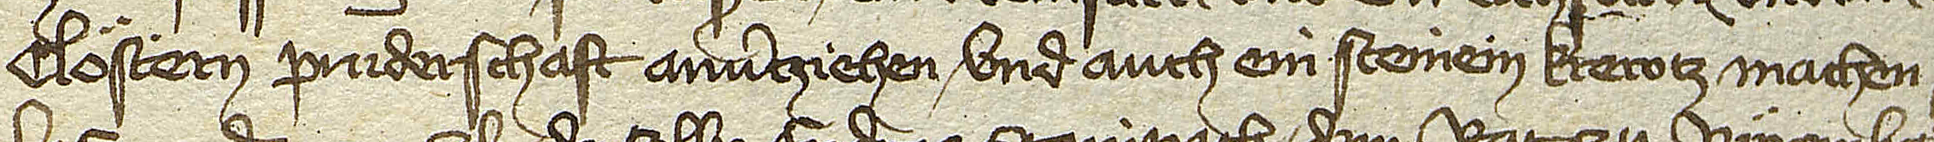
Clöſtern pruderſchaft anu*cʒiehen / vnd auch ein ſteinein krewcʒ machen
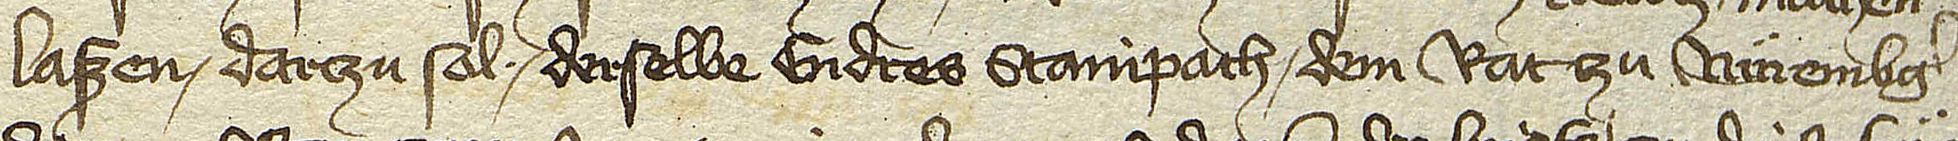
laſʒen / darcʒu ſol ./ derſelbe Endres Stainpach / dem Rat cʒu Nürembg*
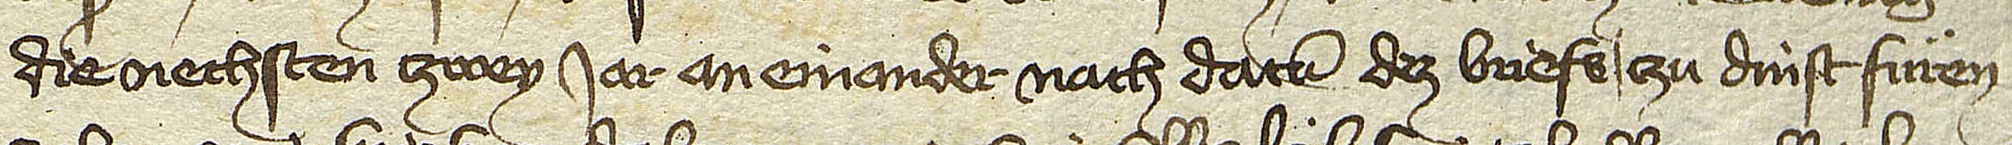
die nechſten cʒwey Iar an einander nach dato* deʒ briefs / cʒu dinſt füren
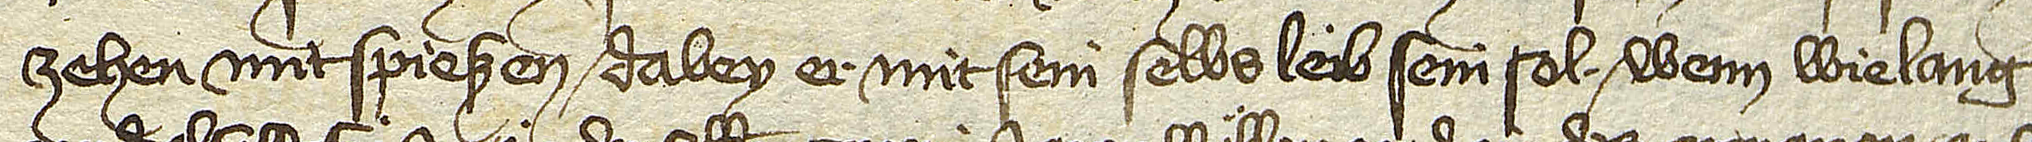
cʒehen mit ſpieſʒen / dabey er mit ſein ſelbs leib ſein ſol ./ wenn wielang
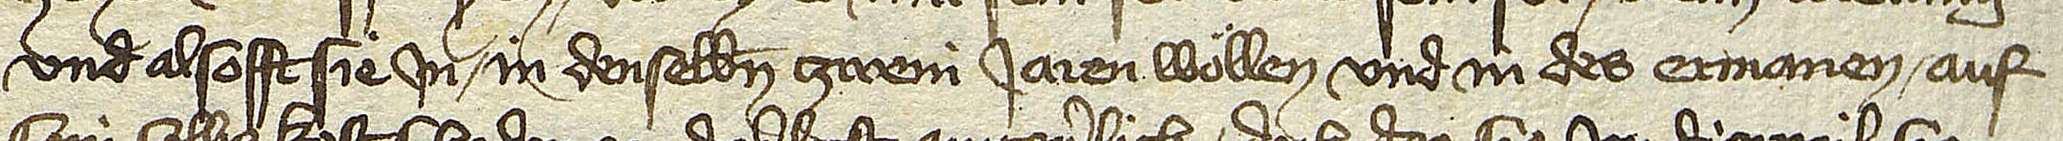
vnd alſofft ſie In / in denſelbn* cʒwein Iaren wöllen vnd in des ermanen / auf
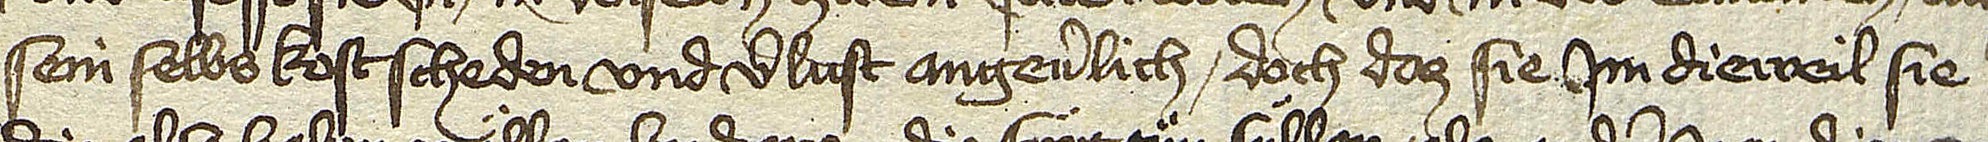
ſein ſelbs koſt ſcheden vnd v*luſt angeu*lich / doch daʒ ſie Im dieweil ſie
